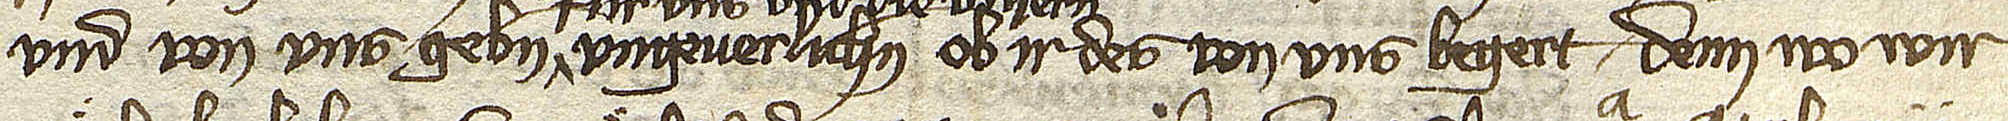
vnd von vns gebn* vngeuerlichn* ob ir des von vns begert / Denn wo wir
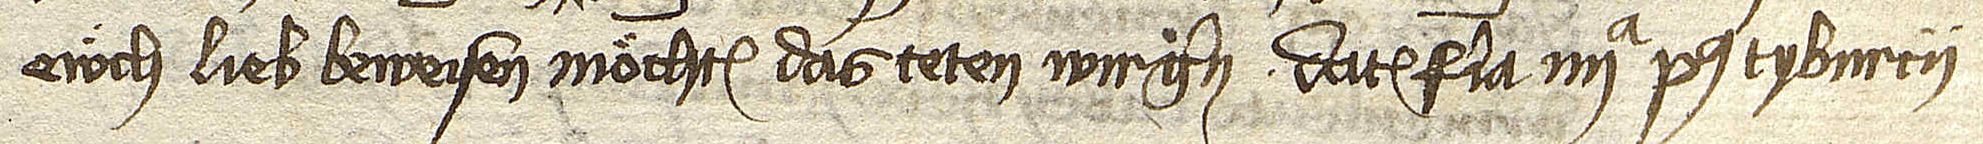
eẅch lieb beweiſen möcht* das teten wir g*n . Dat* fi*a iiii* p* tyburcii
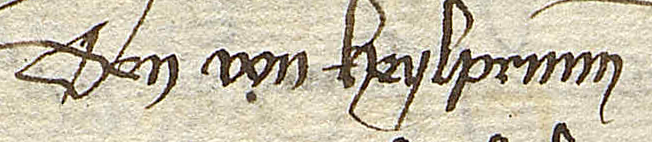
Den von heylprunn*
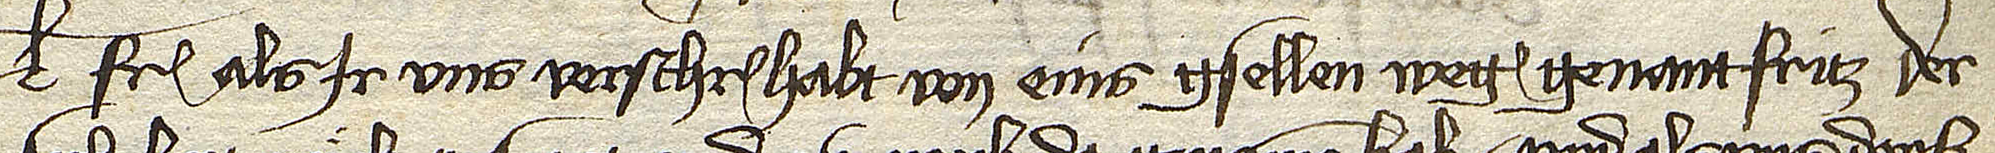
L* fr* als Ir vns verſchr* habt von eins gſellen weg* genant fricʒ der
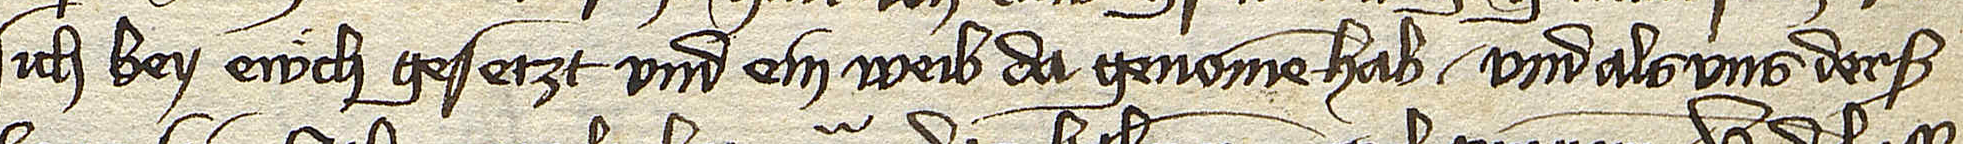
ſich bey eẅch geſecʒt vnd ein weib da genome* hab / vnd als vns derſ*
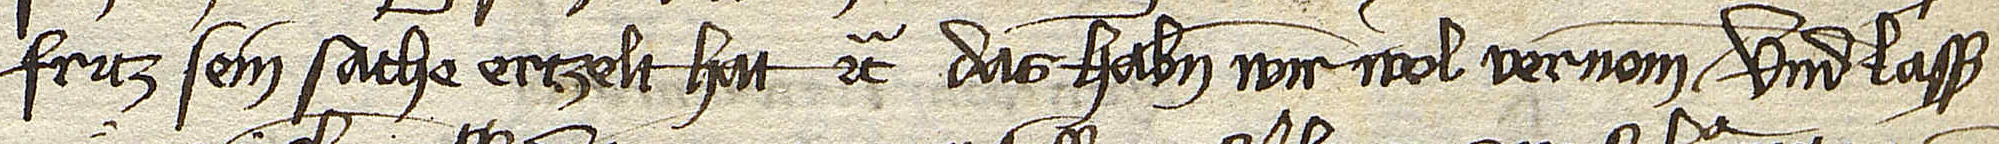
fricʒ ſein ſache ercʒelt hat ec* das habn* wir wol vernom* / Vnd laſſ*
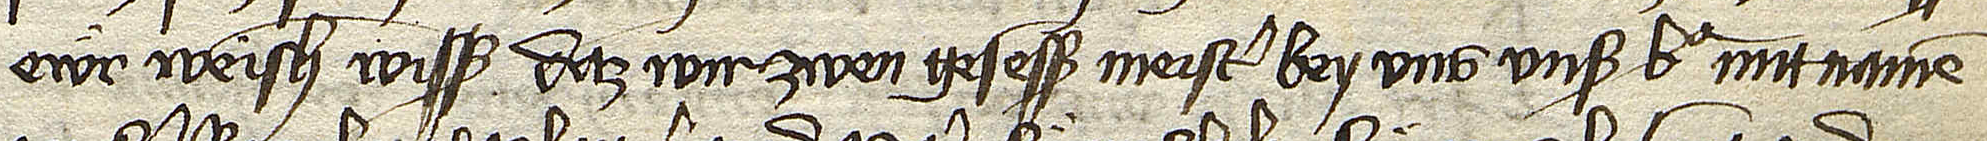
eẅr weiſh* wiſſ* daʒ wir ʒwen geſeſſ* meiſt* bey vns b* mit name*
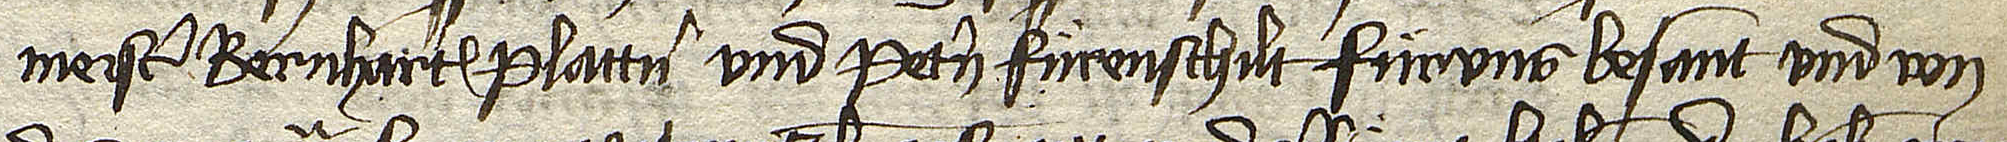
meiſt* Bernhart* Plattn* vnd Petn* fürenſchilt für vns beſant vnd von
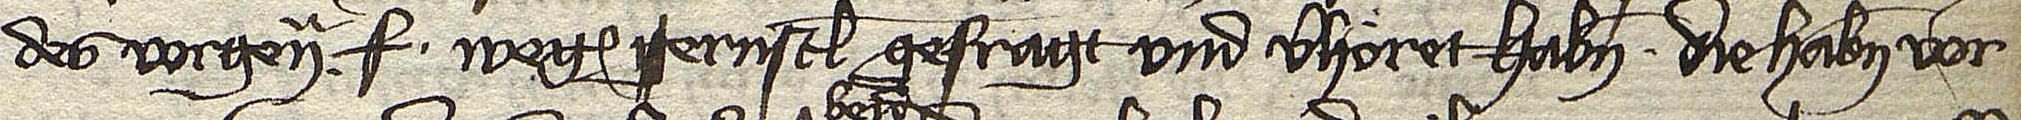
des vorgen* . f . weg* g ernſtl* gefragt vnd v*höret habn* . die habn* vor
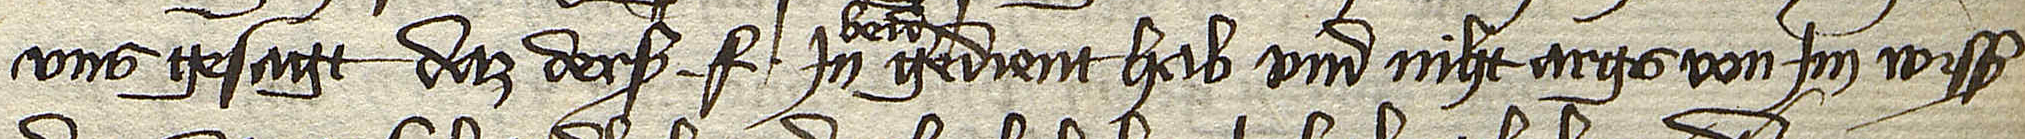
vns geſagt daʒ derſ* f* In gedient hab vnd niht args von Im wiſſ*
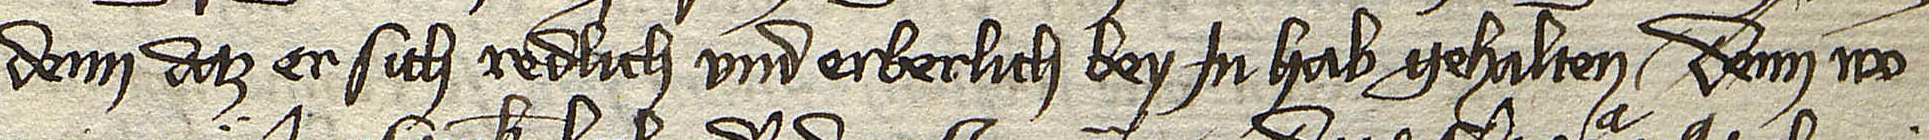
denn daʒ er ſich redlich vnd erberlich bey In hab gehalten / Denn wo
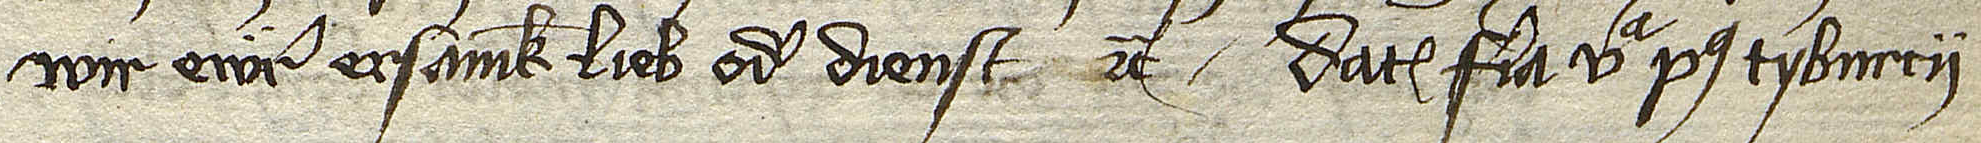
wir eẅr* erſamk* lieb od* dienſt ec* / Dat* fi*a v* p* tyburcii
